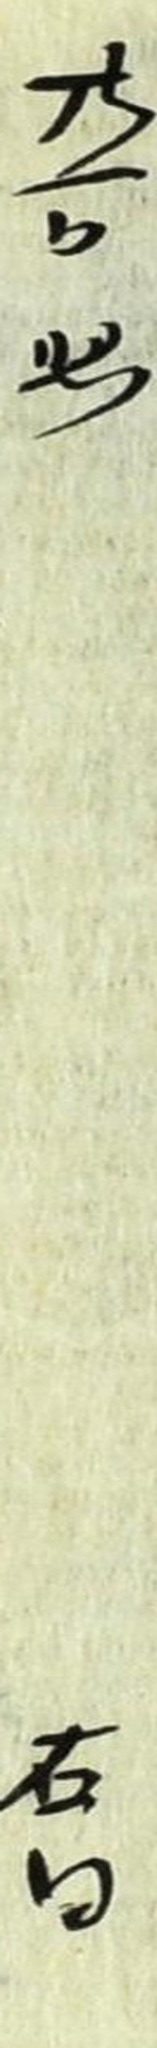廿一日照右同
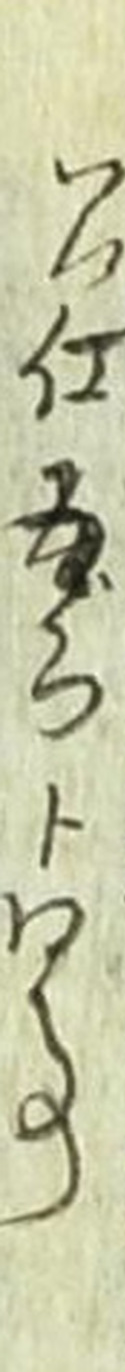召仕五郎右衛門ト同事
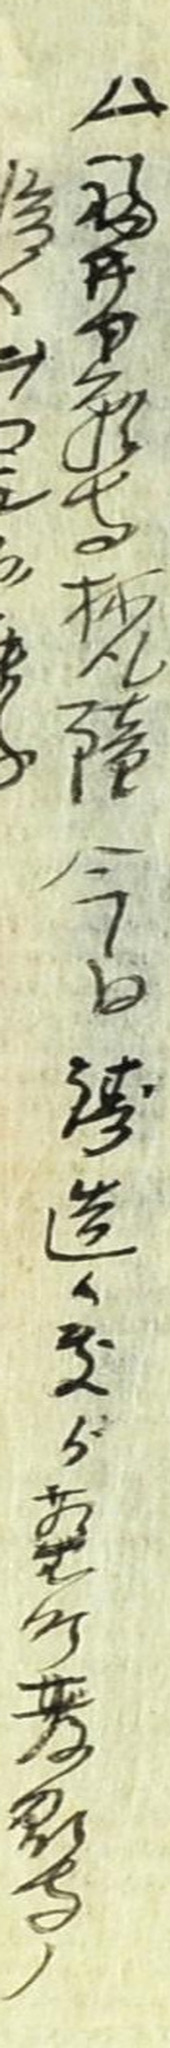△福井本願寺梵鐘今日鋳造候処ゟ散町孝顕寺ノ
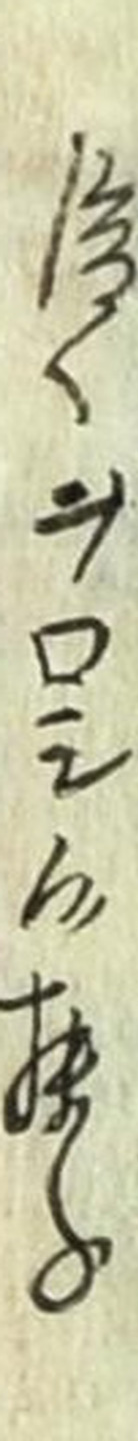後へヲロシ候様子
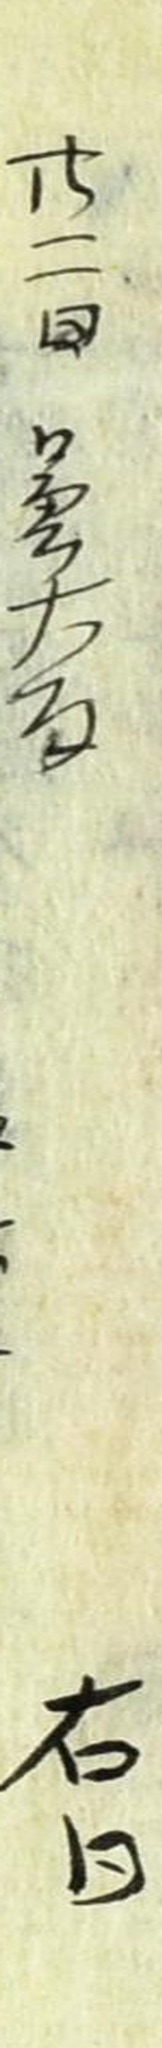廿二日曇大雨右同
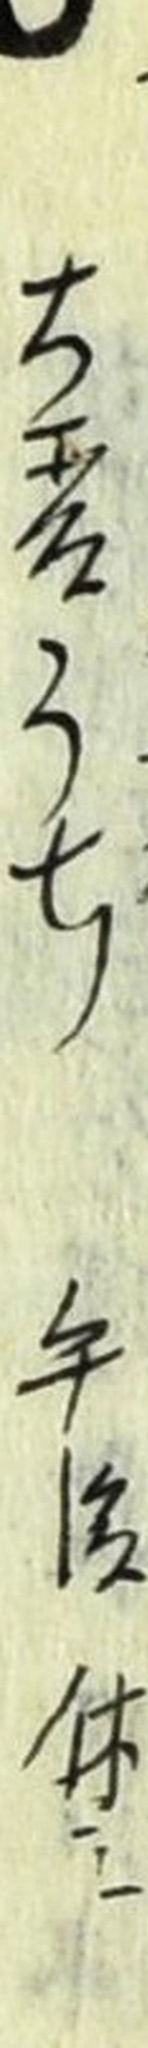○大麦うち午後休ミ
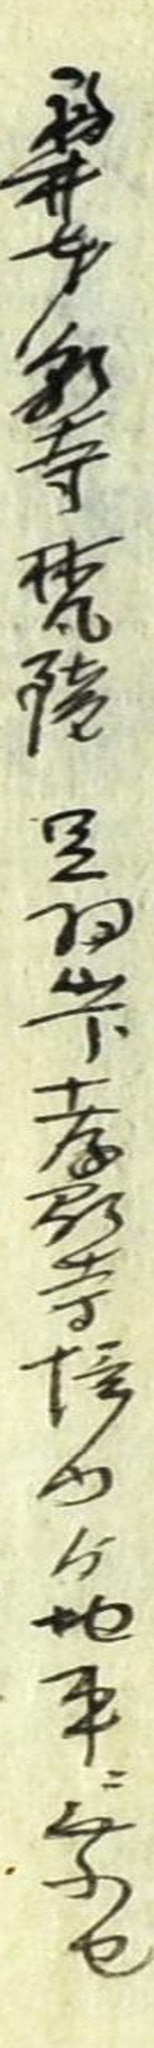福井本願寺梵鐘足羽山下孝顕寺境内ゟ地車ニ乗セ

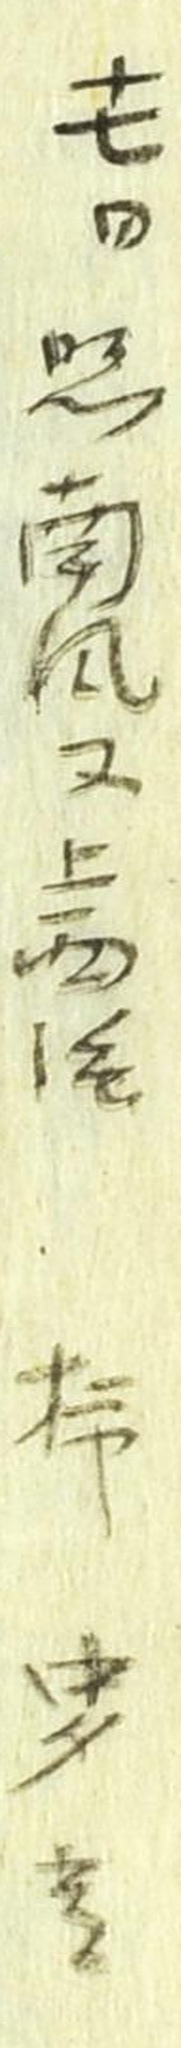十七日照南風又上西強柿中夕常
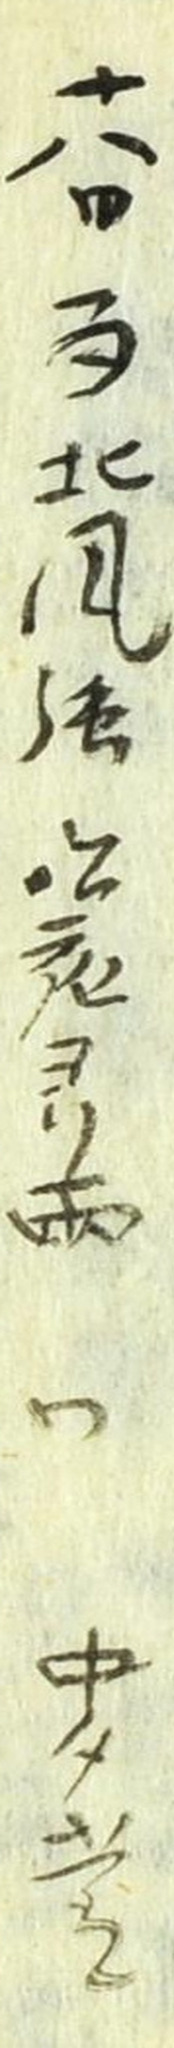十八日雨北風強昨夜ヨリ雨同中夕常
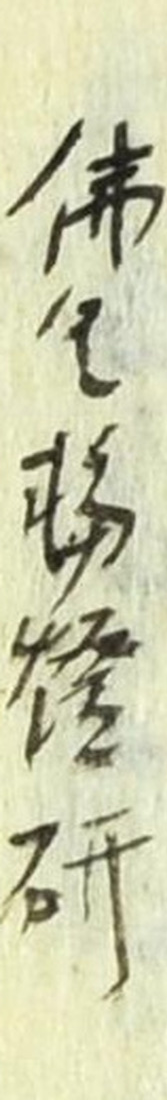仏具輪灯研
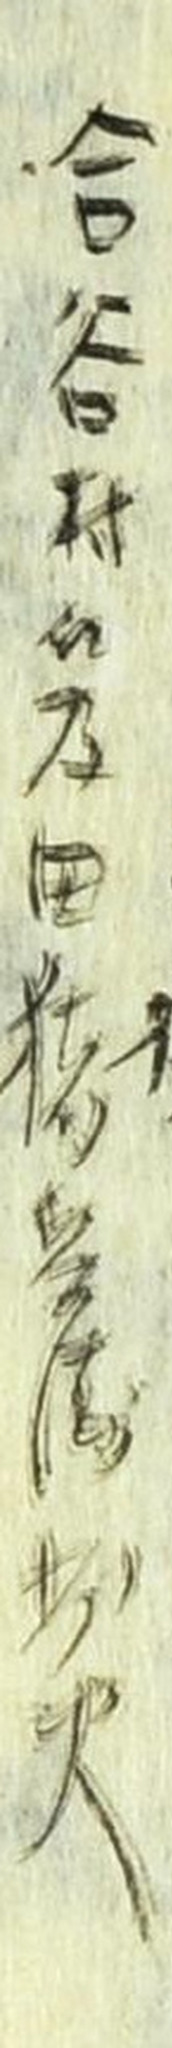合谷村笈田猪兵衛出火
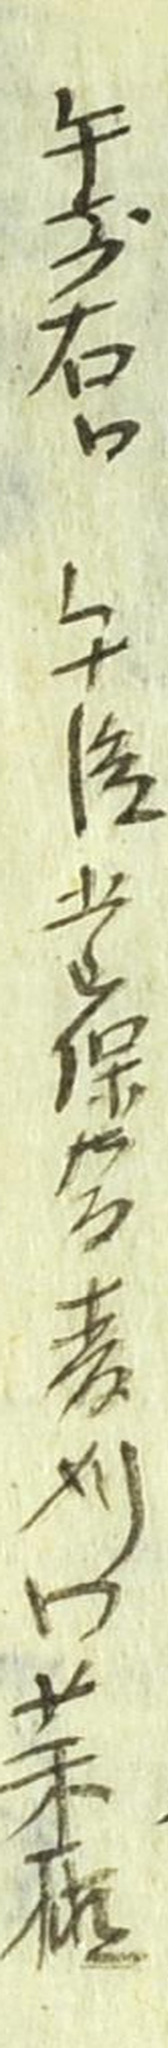午前右同午後堂保蕎麦刈同菜植
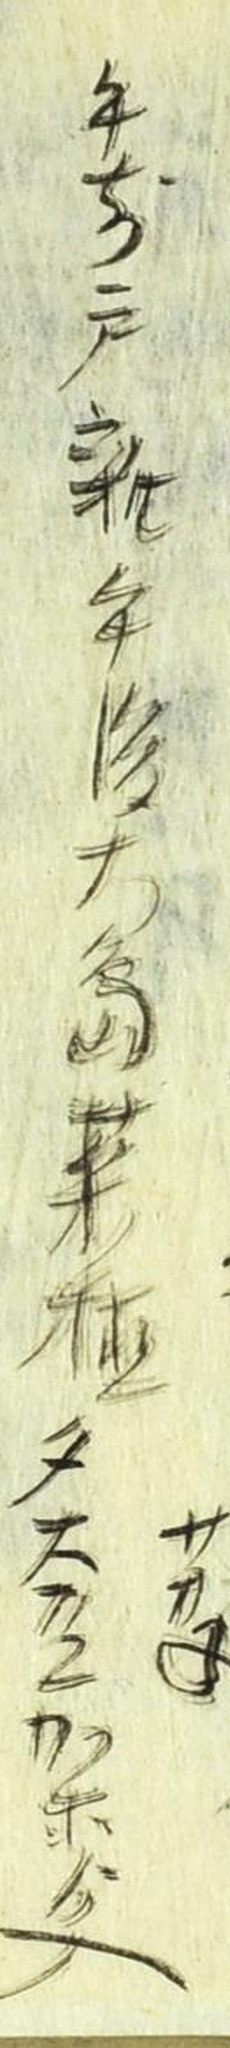午前戸雑午後大島菜植夕大豆架ゟ入
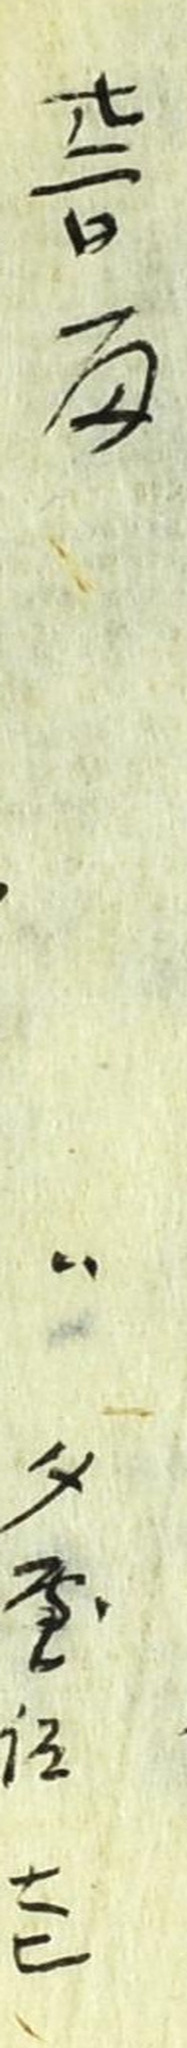廿二日雨同夕団沢大ヒ
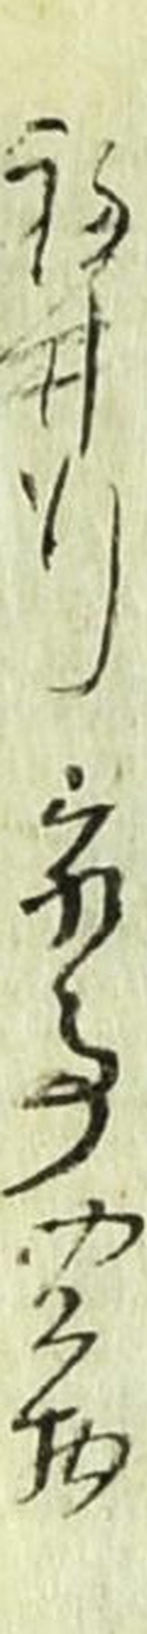福井行家事買物
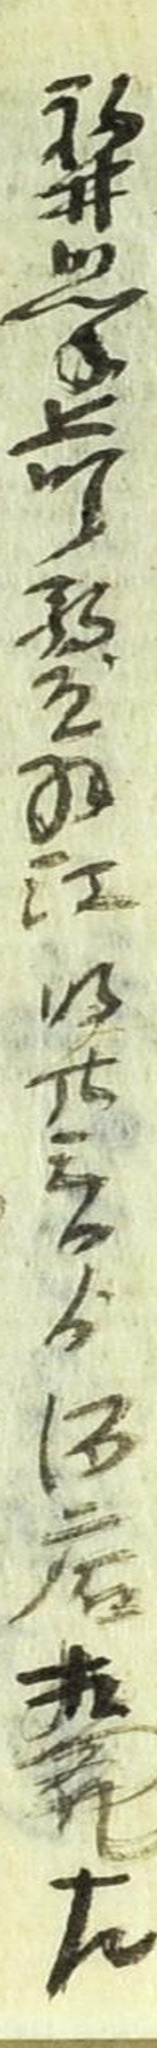福井照手上町駒屋様江明廿三日ゟ酒店相開左
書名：（日記）
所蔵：福井県文書館 Fukui Prefectural Archives
